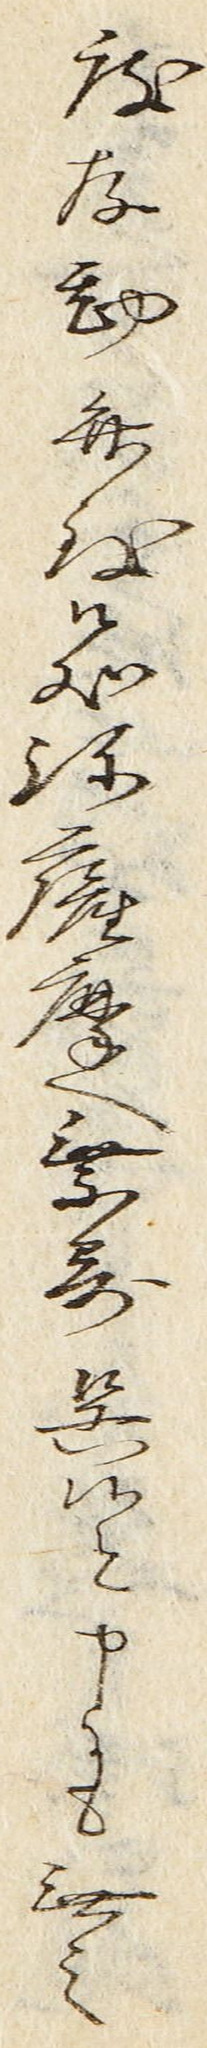度存勘弁致候処弥薩摩へ乗寄呉候と申にも無之
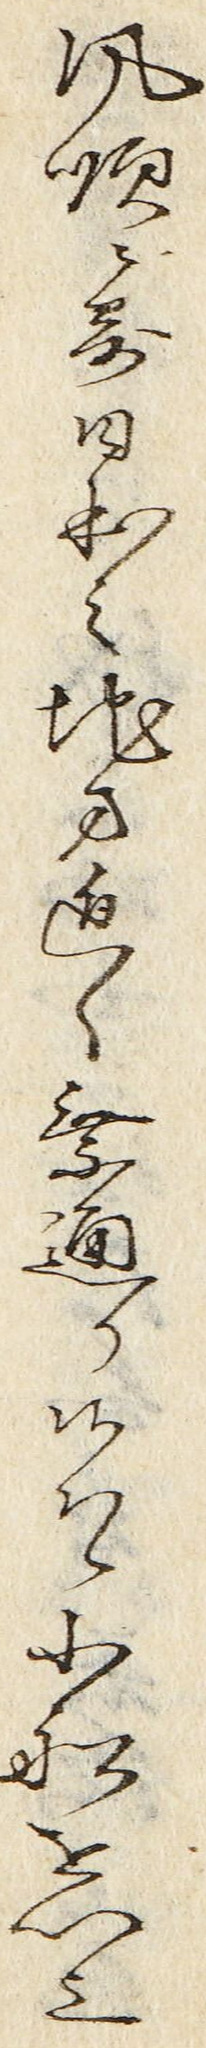風順に寄日本之地方近く乗通り候はゝ小船を以上
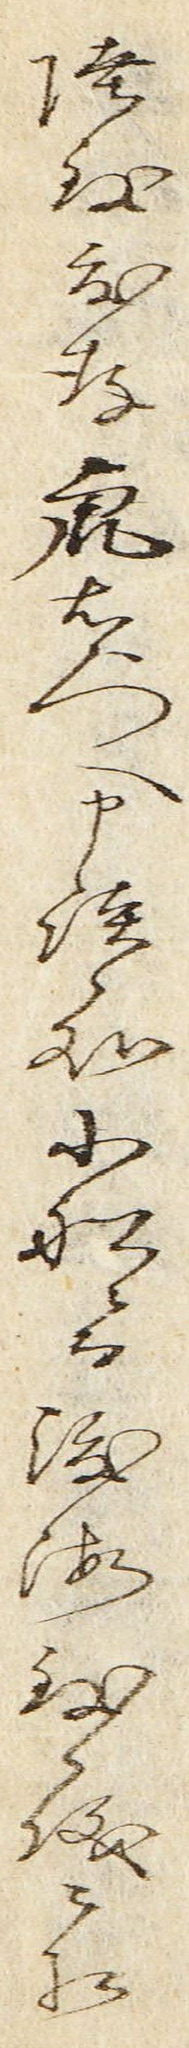陸致度存虎右衛門へ申談候処小船に而渡海致候儀に相

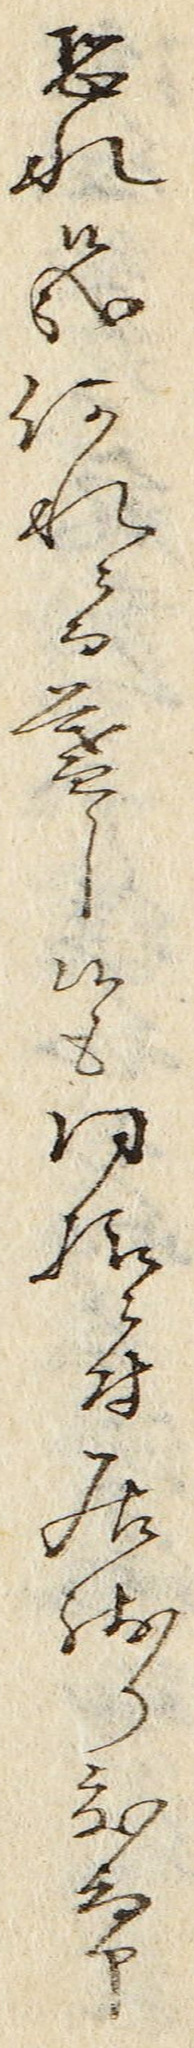恐れ候哉何れに而暮し候も同様に付居残り度旨申
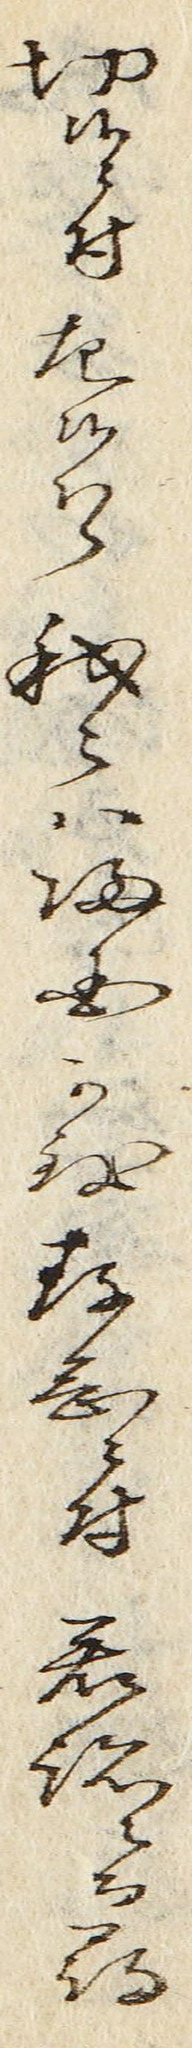切候に付左候はゝ我らは帰国可致存念に付若跡に而尋
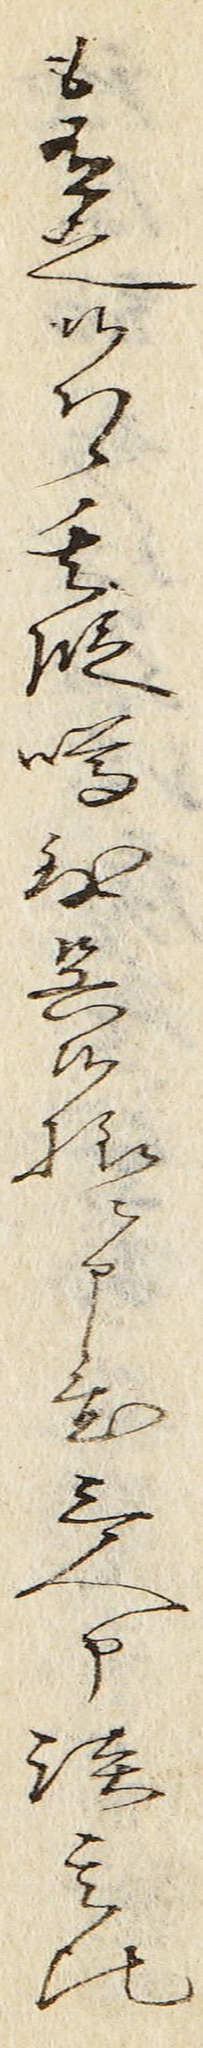も有之候はゝ其段噂致呉候様に申置三人申談其比
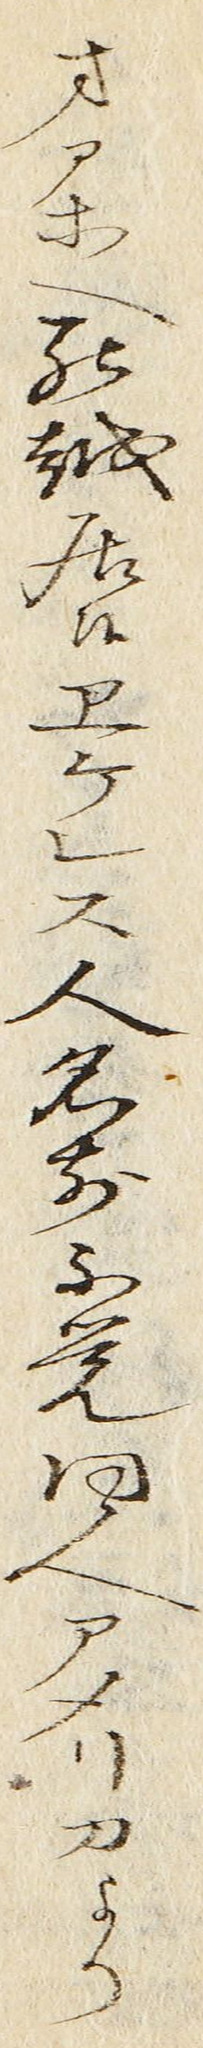オアホへ罷越居候エケレス人名前不覚同人アメリカより
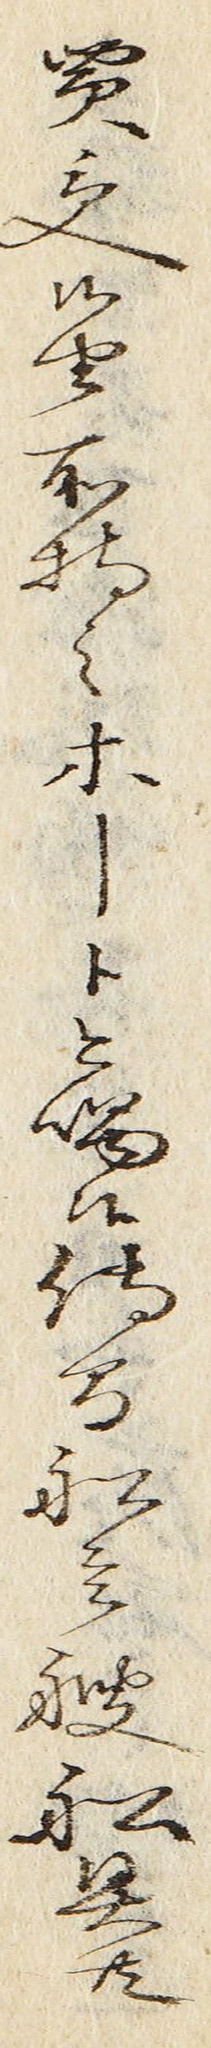買受候由所持之ホートと唱候伝間船壱艘船具共
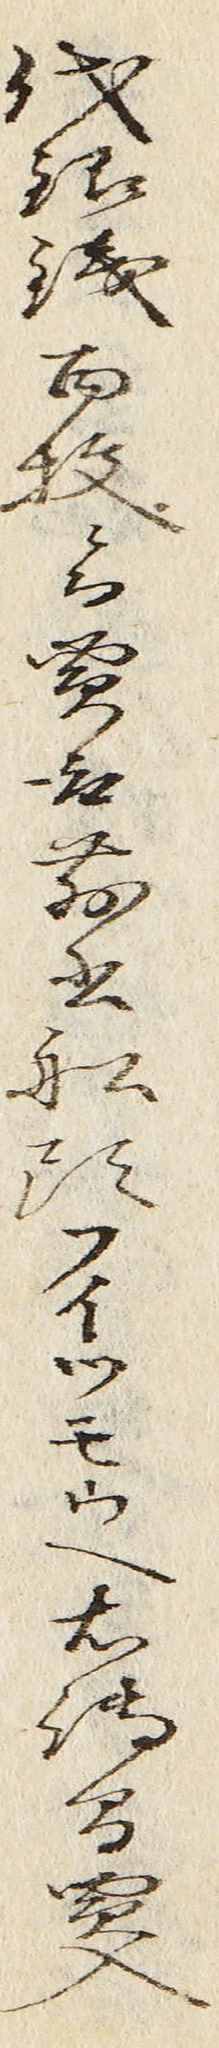代銀銭百枚に而買取前書船頭フイツモウへ右伝間買入
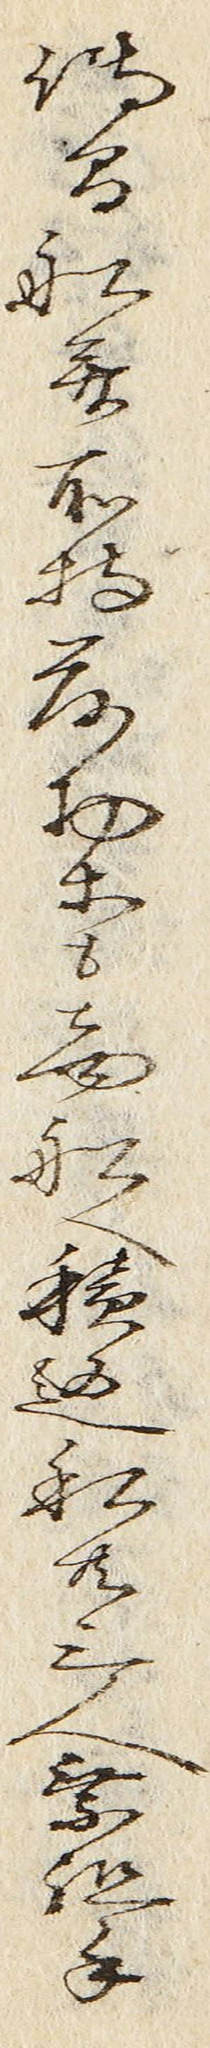候間船并所持荷物等も商船へ積込私共三人乗組手
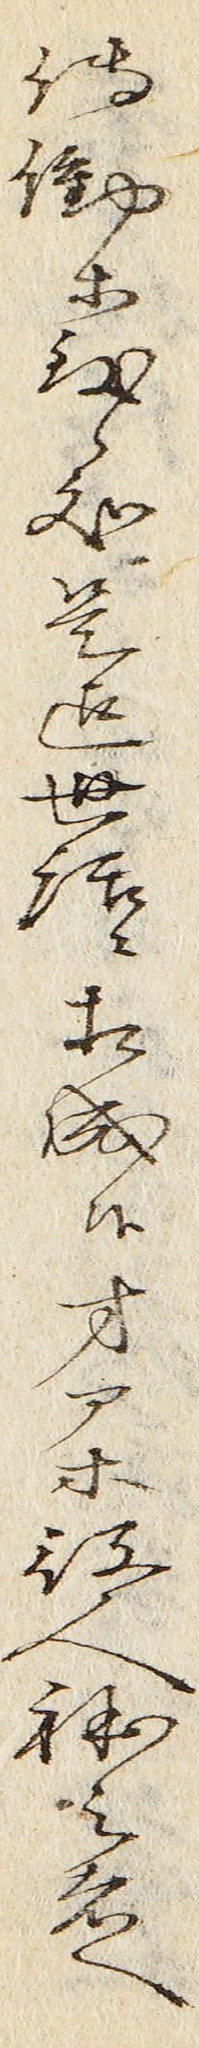伝働等致候処是迄世話に相成候オアホ役人躰之者へ
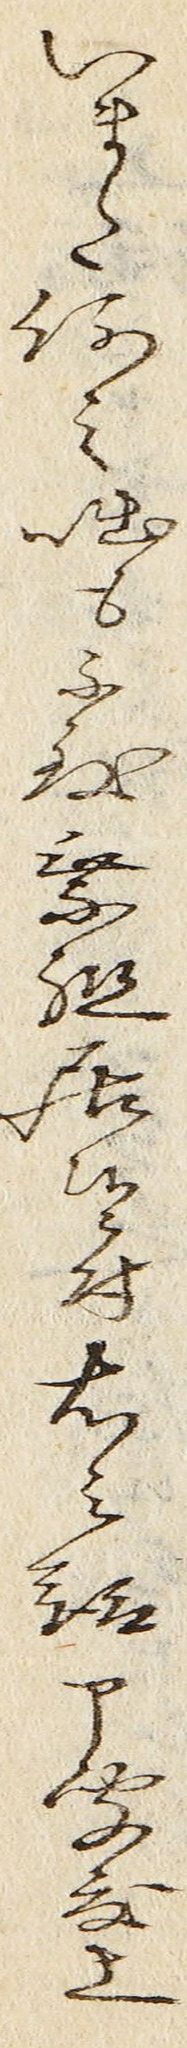いまた例之咄も不致乗組居候に付右之趣申聞度上
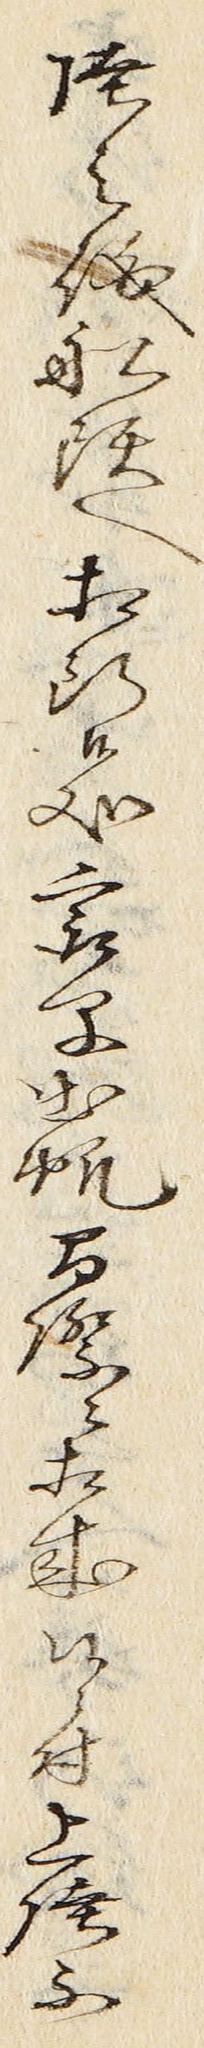陸之儀船頭へ相断候処最早出帆間際に相成候に付上陸不
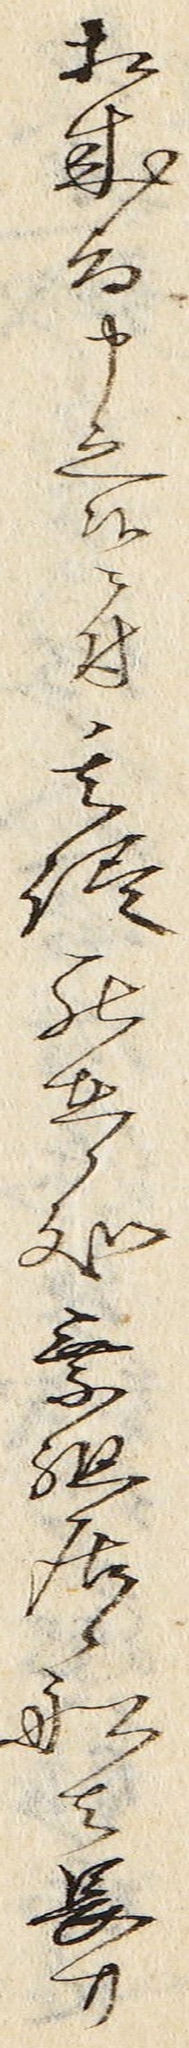相成旨申之候に付其侭罷在候処乗組居候船は長さ
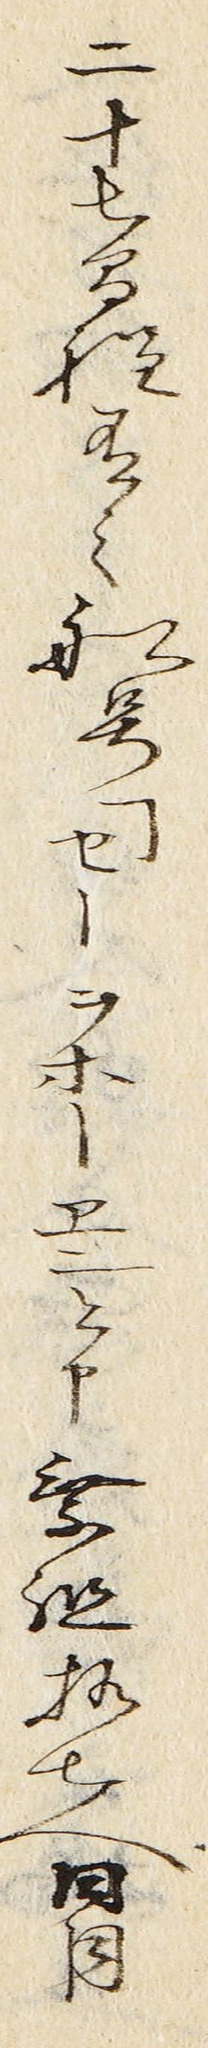二十七間程有之船号「セーヲホーエンと申乗組拾七人日月
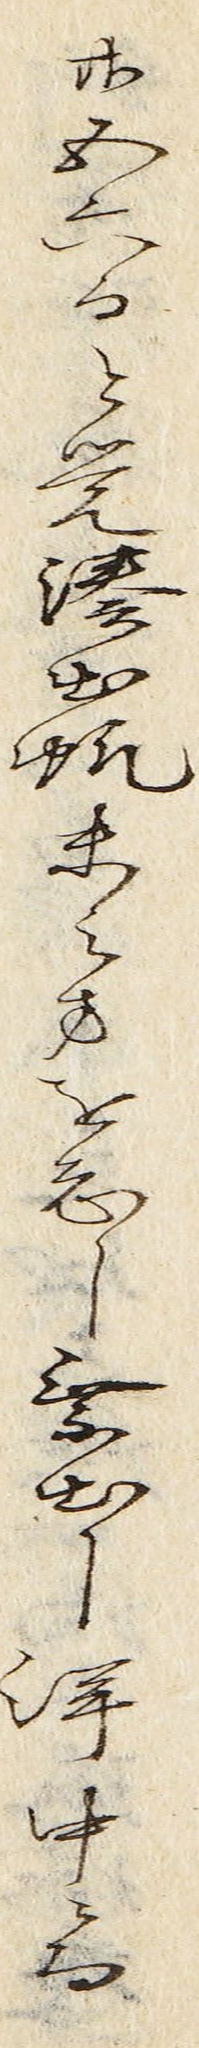廿五六日と覚湊出帆未之方を志し乗出し用洋中に而
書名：土佐中浜万次郎漂流記
